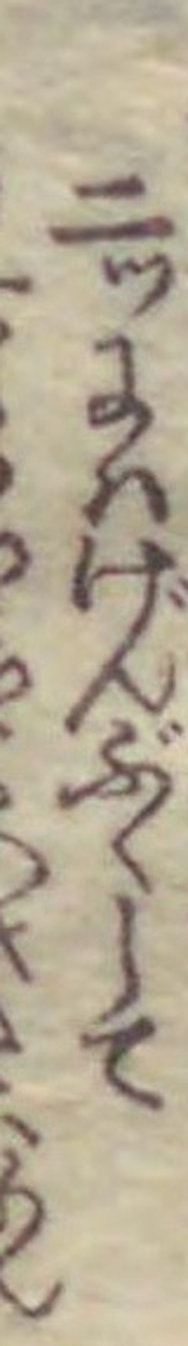二つにはげんぶくして
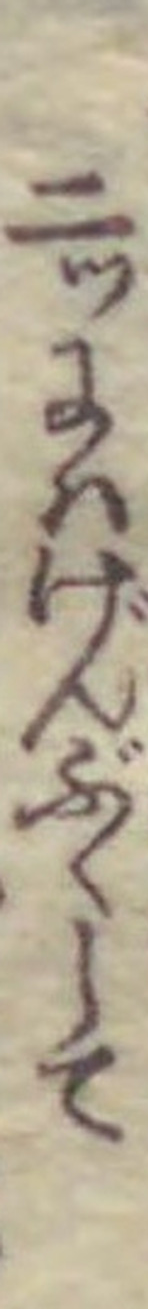二つにはげんぶくして
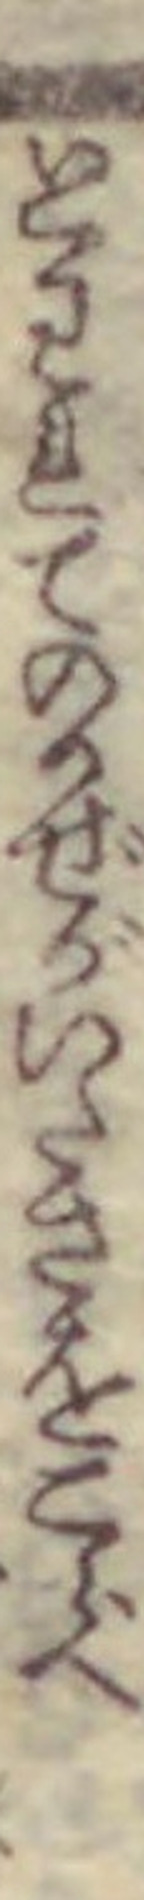とわれてのかぜがいたさをこらへ
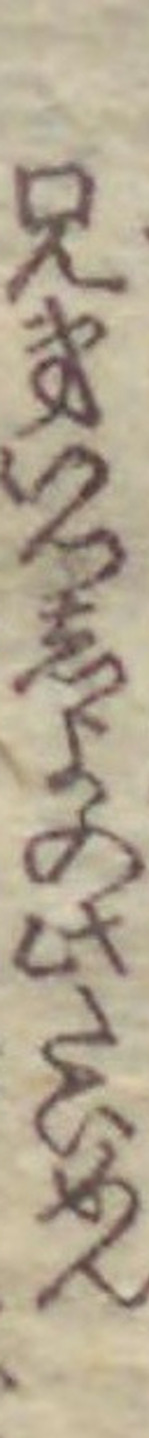兄弟いつしよの此たいめん
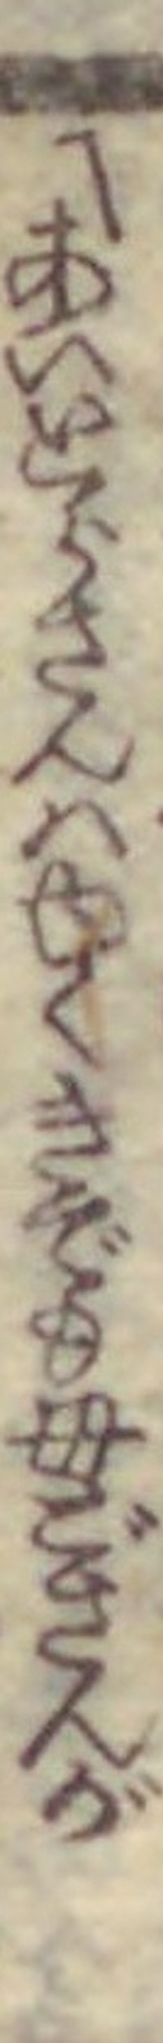〽あいとらさんはゆくきでも母ごさんが
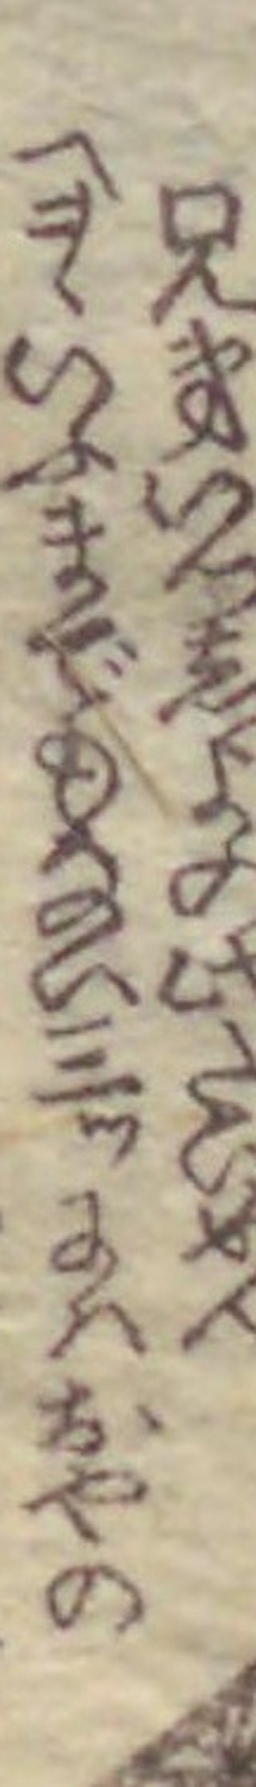〽ヲヽいふまでもない三つにはおやの
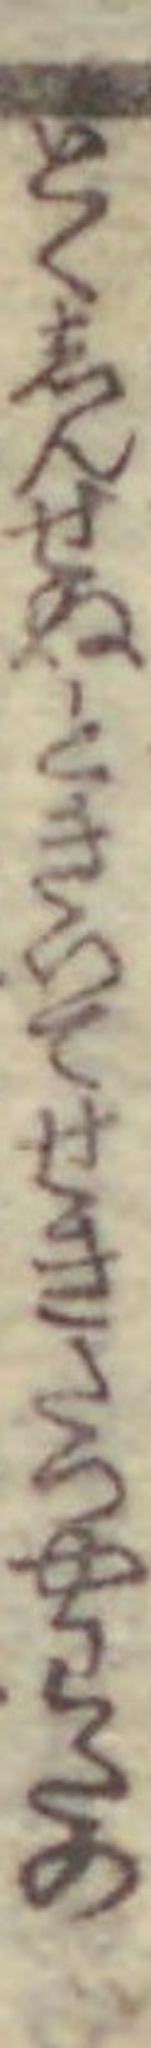とくしんせぬときいてせきたつやわたの
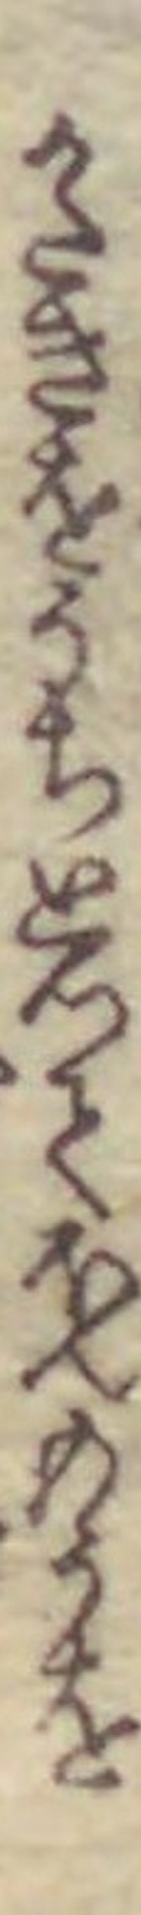かたきをうちとつてほんもうを
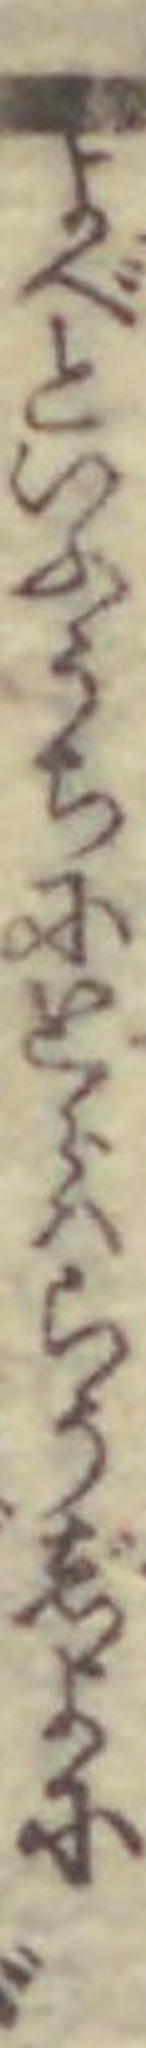よべといふうちにとらはらうじよに
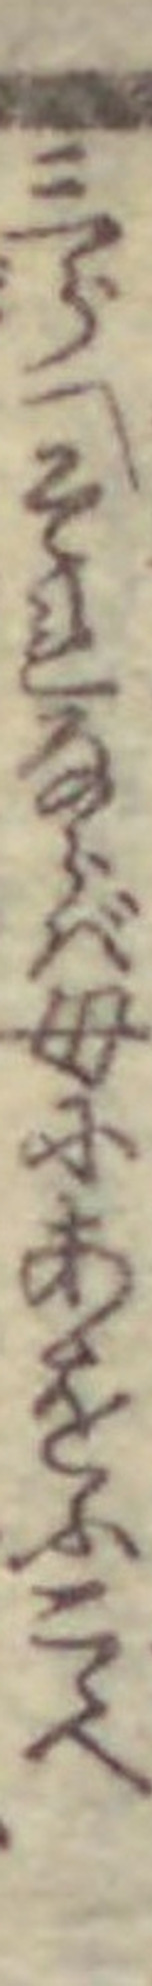三郎〽それならば母にあをふこゝへ
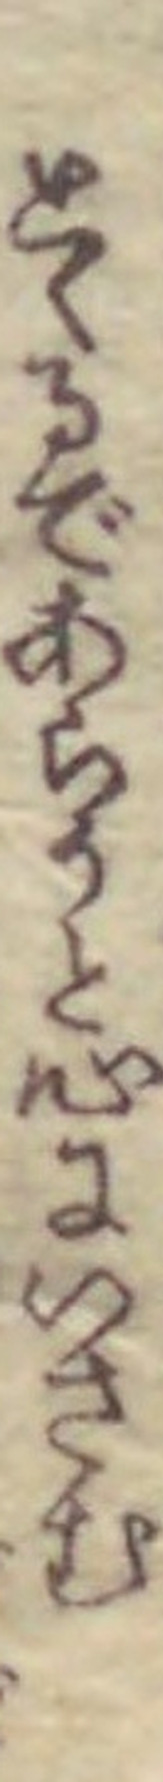とくるであらうと心にいさむ
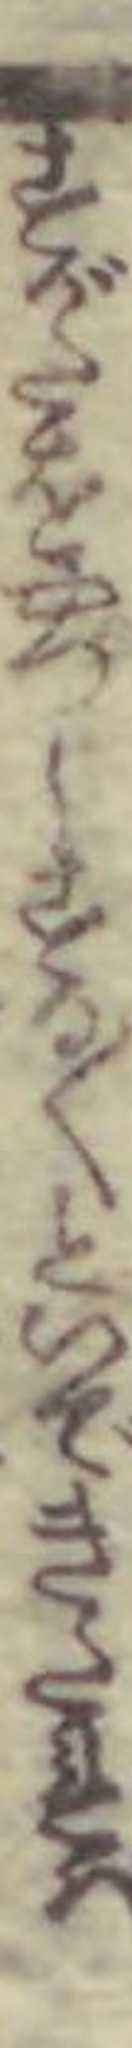すがたをやつしする〳〵といできたれば
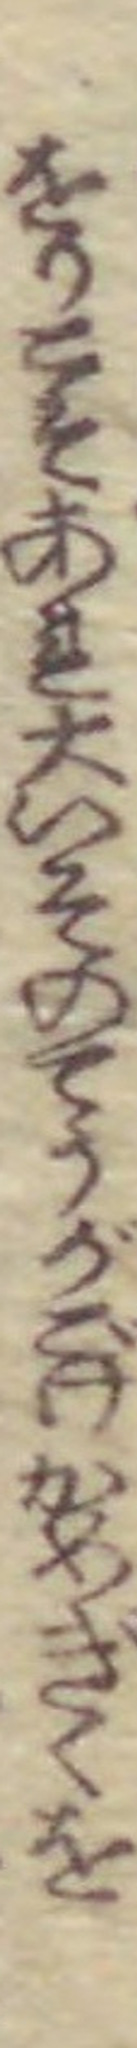をりこそあれ大いそのてうがごけかめぎくを
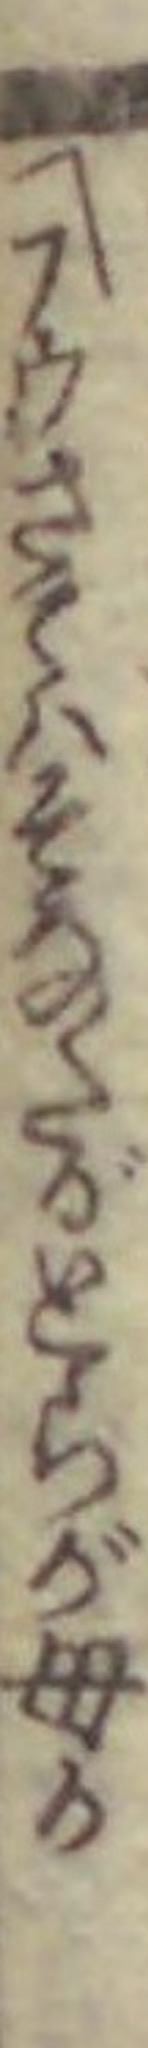〽フウさてはそなたがとらが母か
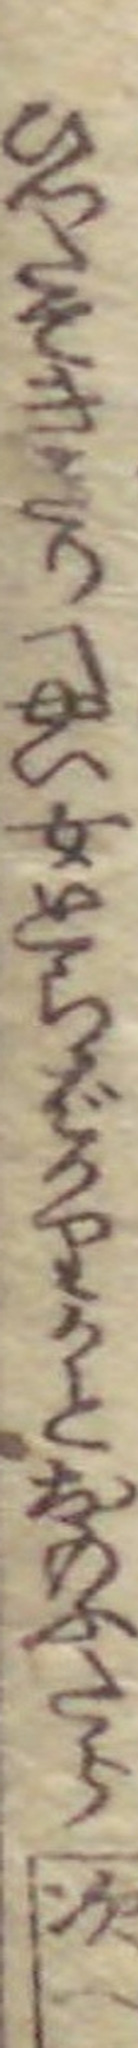ひつたてきたり〽やい女とらばかりかとおもふたら次へ
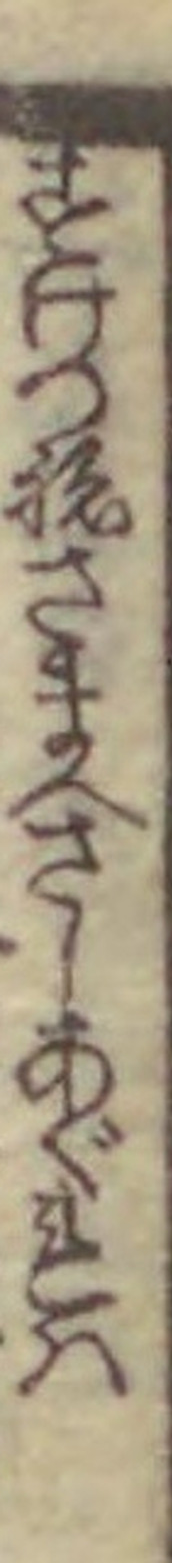すけつねさまへさしあぐれは
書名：大時代唐土化物 3巻. 曽我太夫染
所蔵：国立国会図書館 National Diet Library, JAPAN
